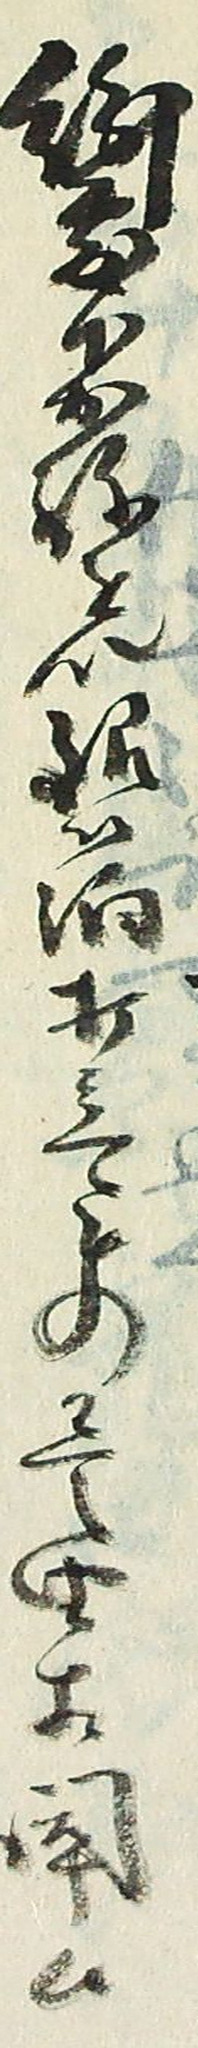紛敷下かねを以銀箔打立候もの有之由相聞候
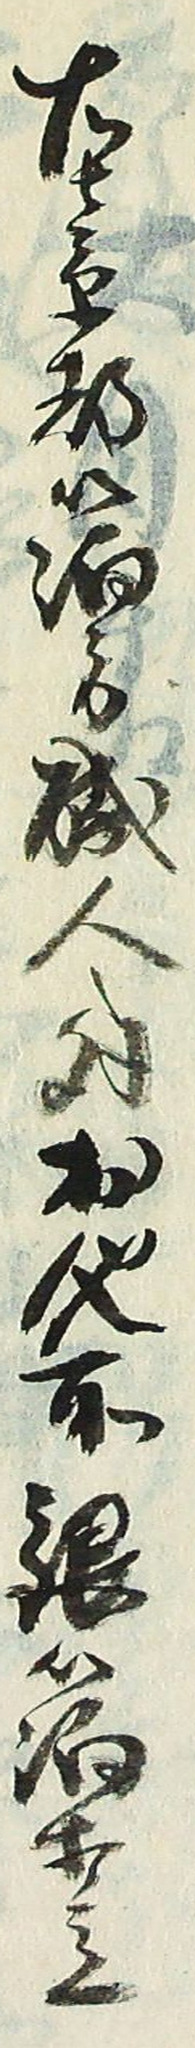右は京都箔方職人之外於他所銀箔打立
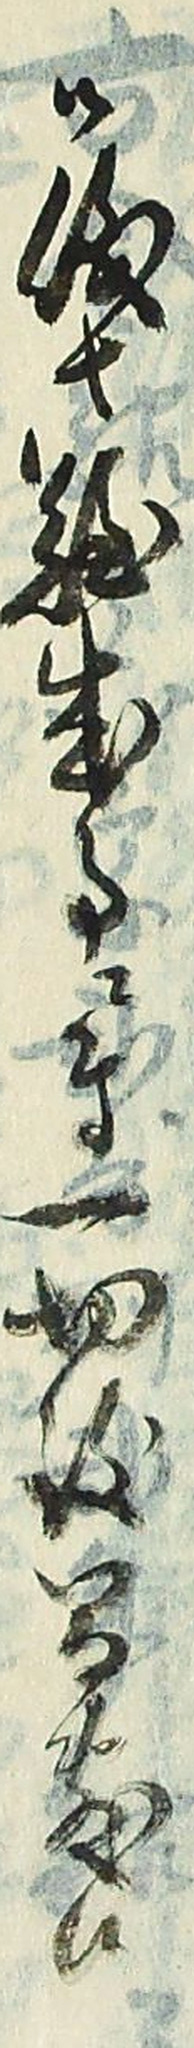候儀は難成事に付一切致間敷候
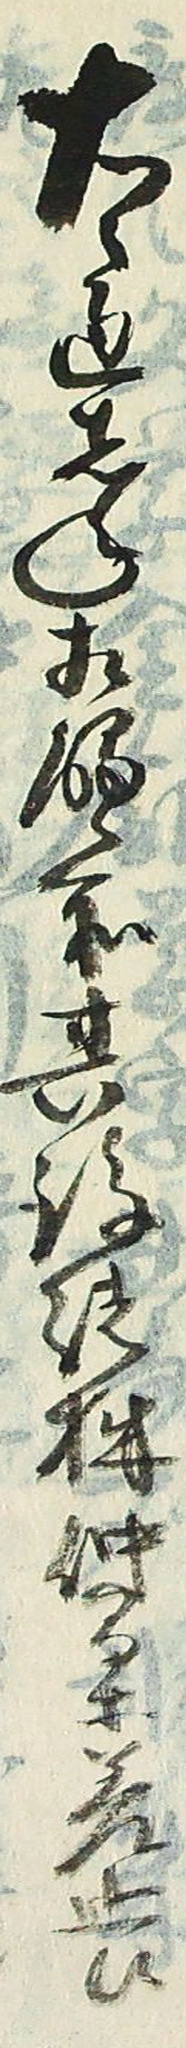右之通先年相触候所其後諸株仲間等差止候
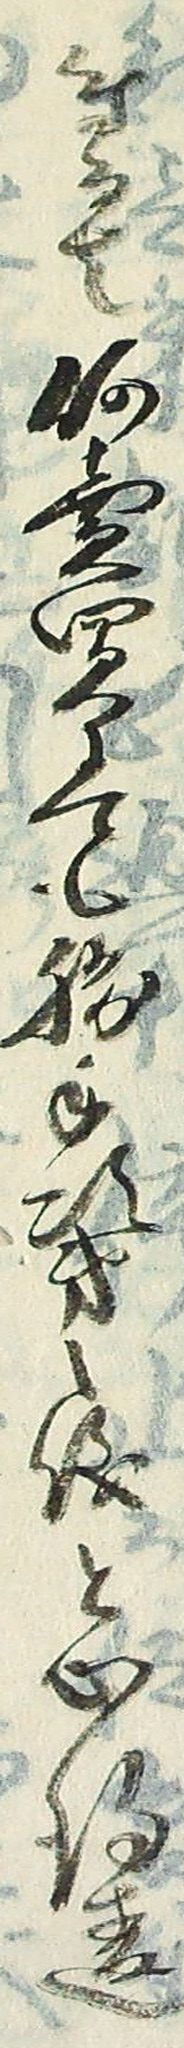付ては何売買にても勝手次第之儀と心得違
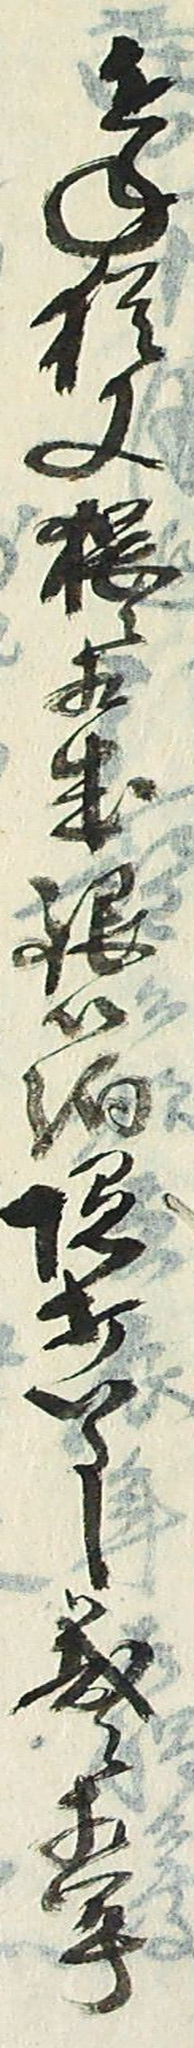近年猶又猥に相成銀箔隠打いたし候哉に相聞
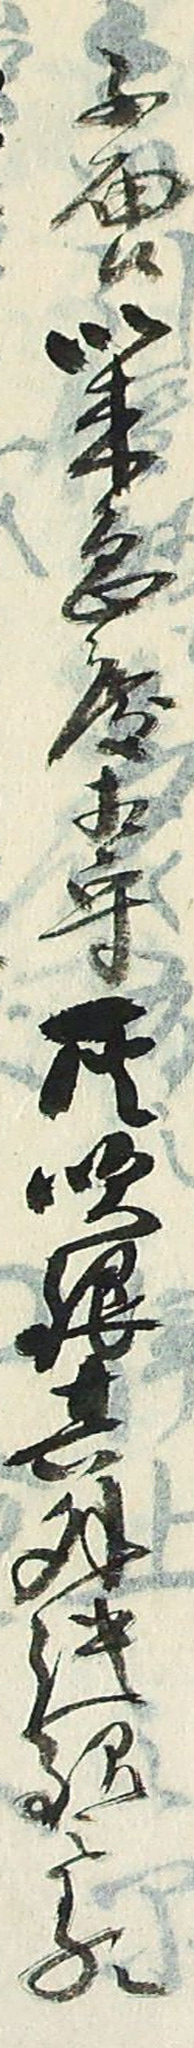不届候以来急度相守灰吹銀其外潰銀之類
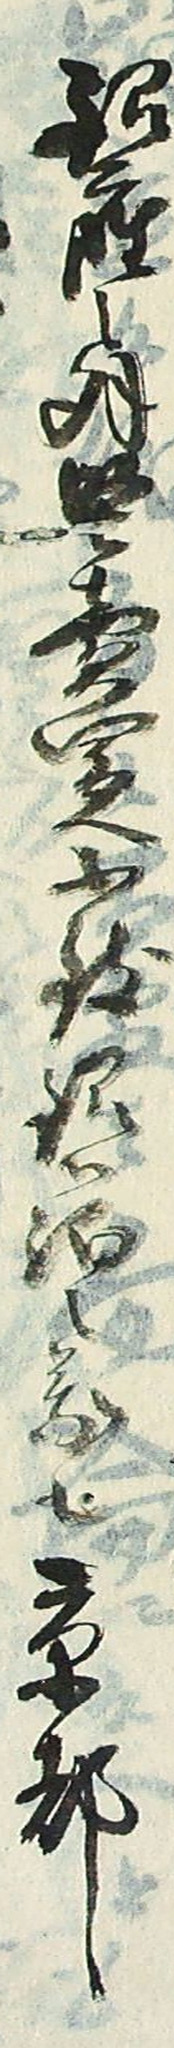銀座之外堅売買不致銀箔之義は京都
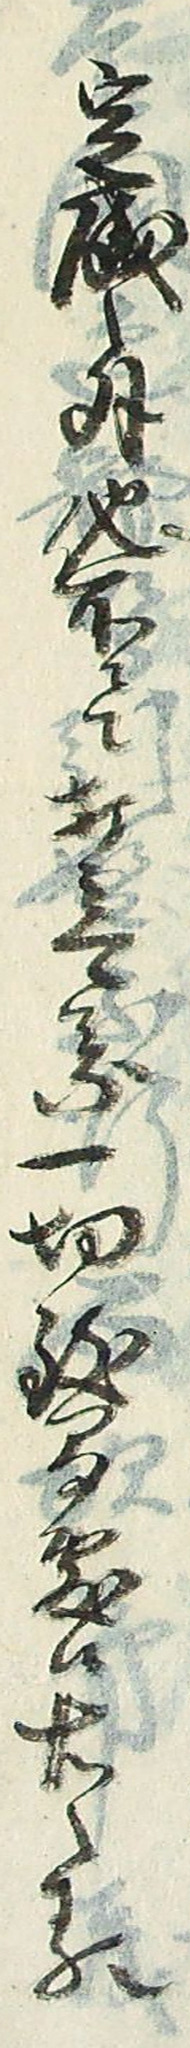定職之外他所にて打立候義一切致間敷候右之類

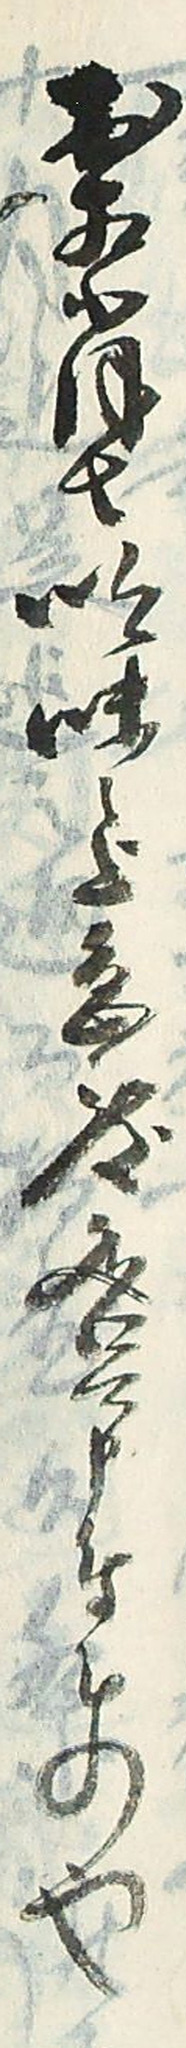於相背は吟味之上急度咎可申付もの也
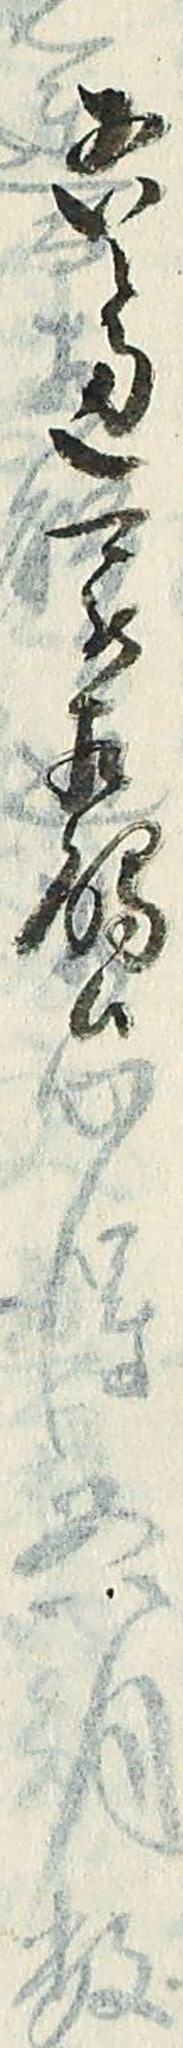右之通可被相触候
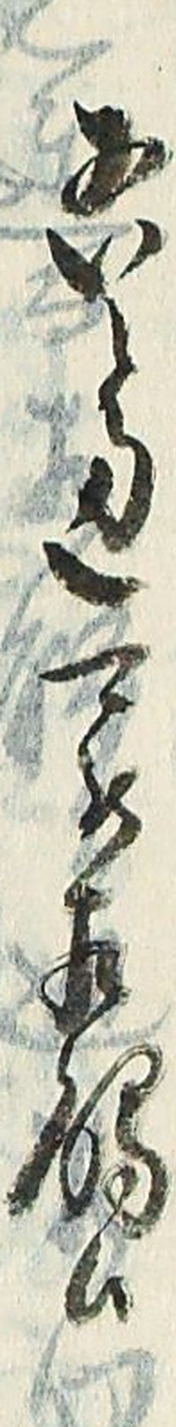右之通可被相触候
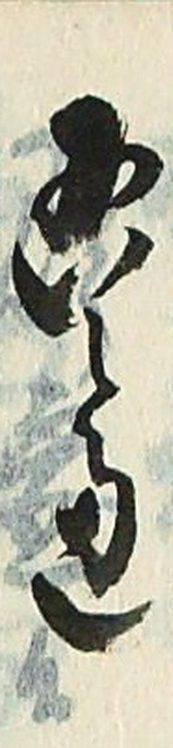右之通
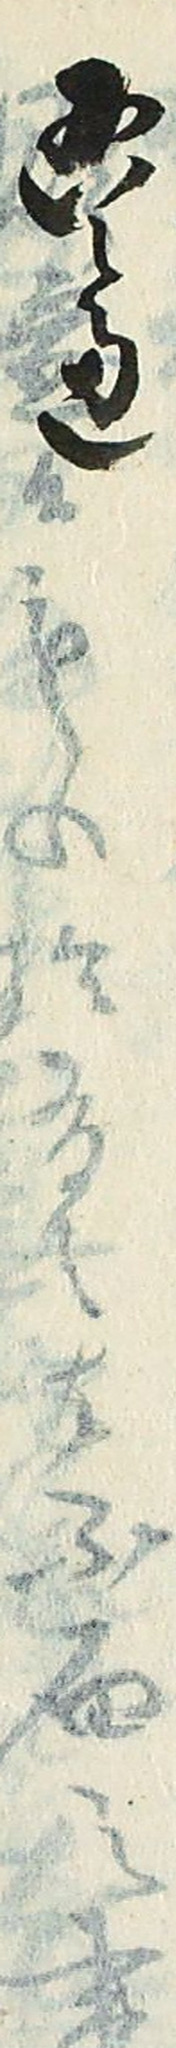右之通
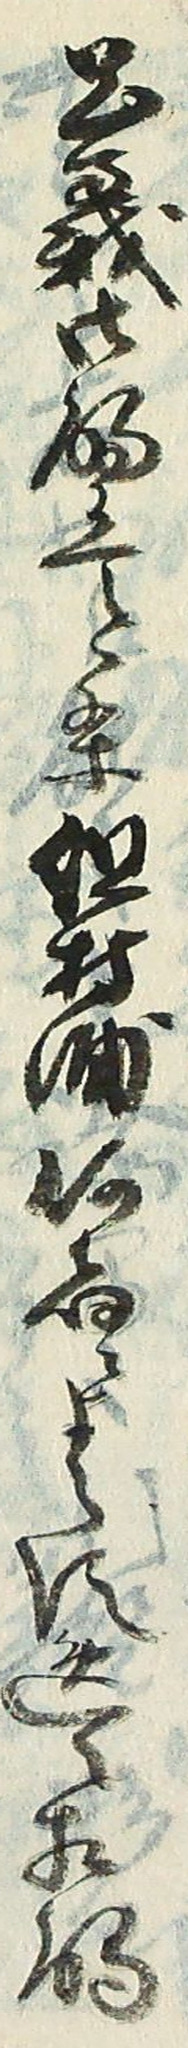公儀御触有之候状組村浦何者によらす逸々相触
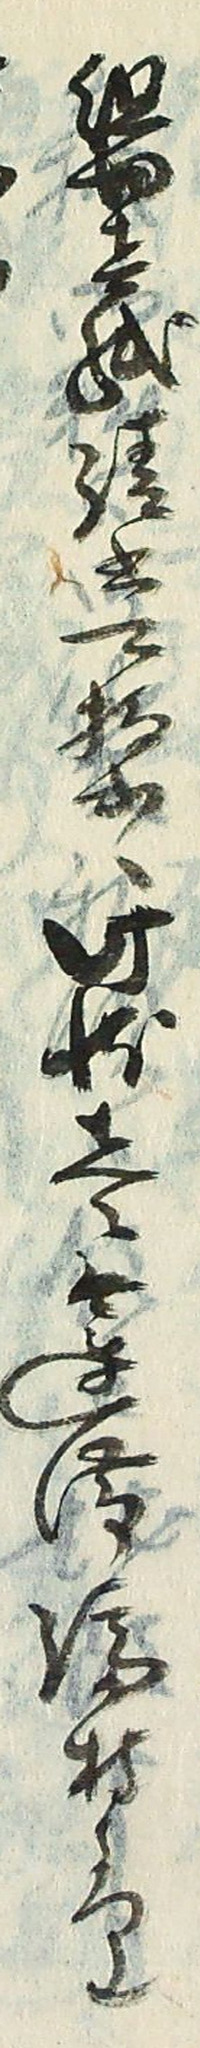組切壱紙請書可指出候此状先々無遅滞済村より
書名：諸御用御□受書控
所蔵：鳴門教育大学 Naruto University of Education
